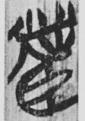僕
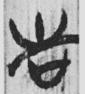告
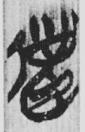○（僕）
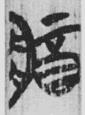𨟻（將）
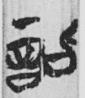訋（召）
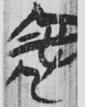○（寇）
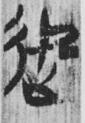○（卜）
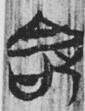命（令）
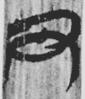尹
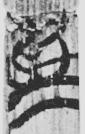爲
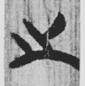之
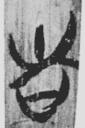告
